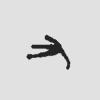又
